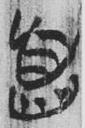面
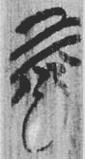而
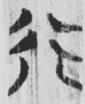行
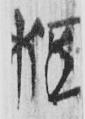柜（矩）
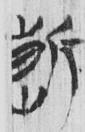折
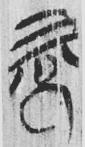而
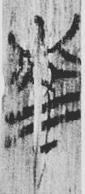南
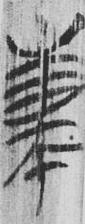東
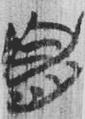面
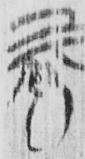而
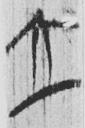立
